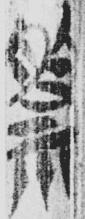祭
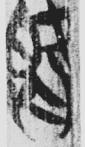既
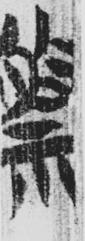祭
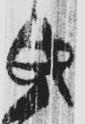𡚦（焉）
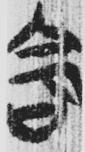命
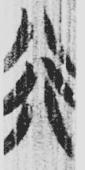行
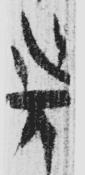先
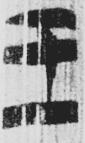王
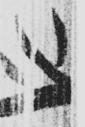之
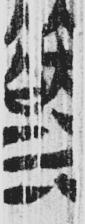灋（法）
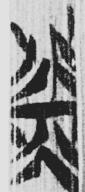癹（發）
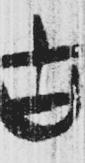古
